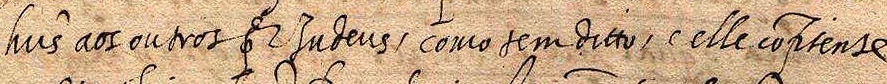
hus̄ aos outros por Judeus, como tem ditto, e elle cōfitente
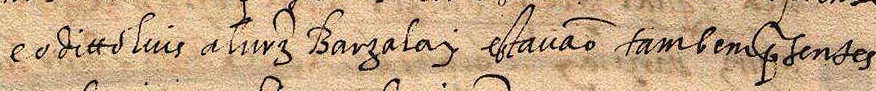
e o ditto luis alurz̄ Barzalay estauão tambem p̄sentes
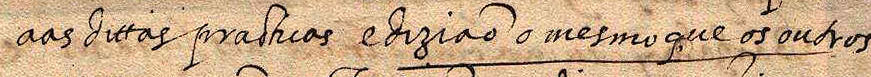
aas dittas practicas e diziaõ o mesmo que os outros
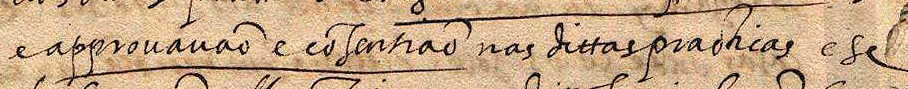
e approuauaõ e cōsentiaõ nas dittas practicas e se
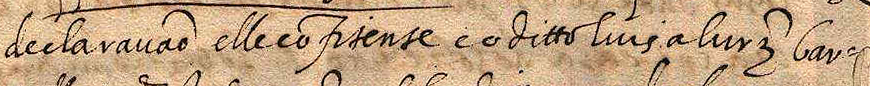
declarauão elle cōfitente e o ditto luis alurz̄ bar
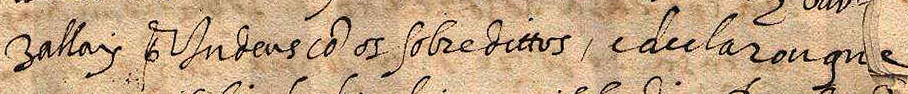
zallay por Judeus cō os sobredittos, e declarou que
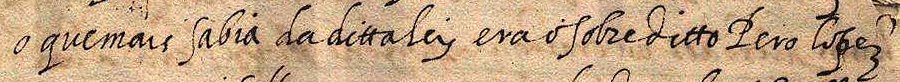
o que mais sabia da ditta ley era o sobreditto Pero lopez̄
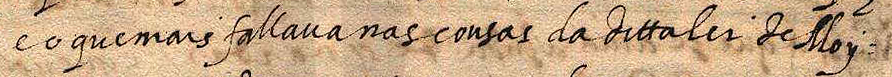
e o que mais fallaua nas cousas da ditta lei de Moy
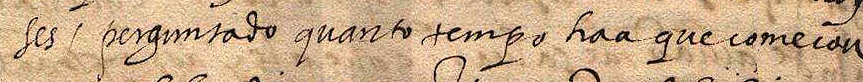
ses, perguntado quanto tempo haa que começou
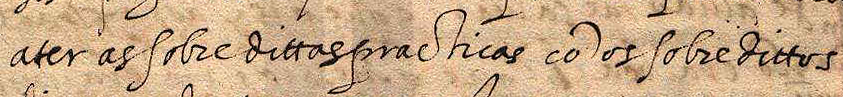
a ter as sobredittas practicas cō os sobredittos
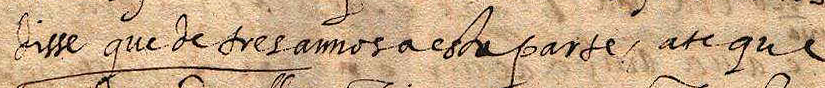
disse que de tres annos a esta parte, ate que
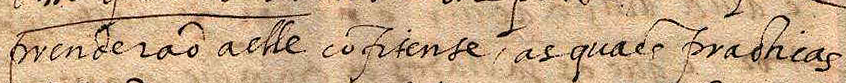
prenderaõ a elle cōfitente, as quaes practicas
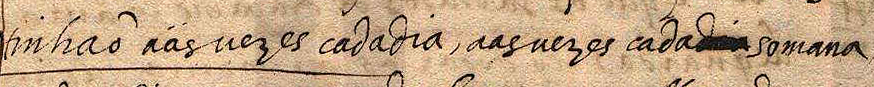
tinhaõ aas uezes cada dia, aas uezes cada dia somana,
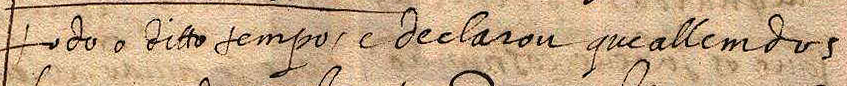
todo o ditto tempo, e declarou que allem dos
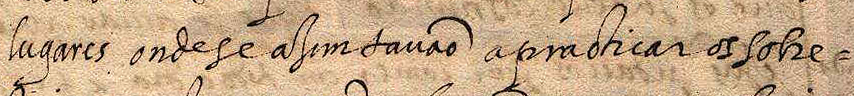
lugares onde se aJuntauão a practicar os sobre
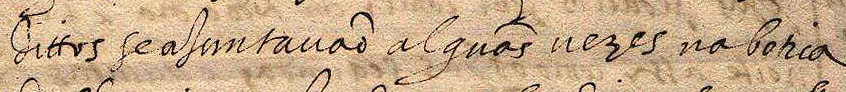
dittos se aJuntauaõ alguās uezes na botica
